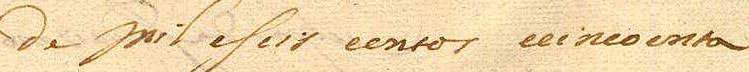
de mil e seiscentos e cincoenta
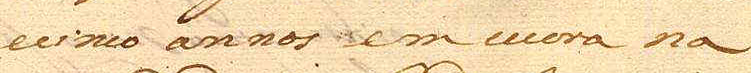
e cinco annos em euora na
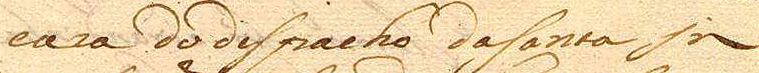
caza do despacho da santa jn
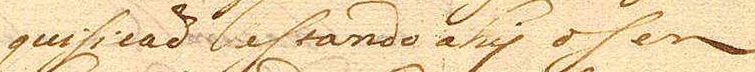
quisicaõ estando ahy o sen
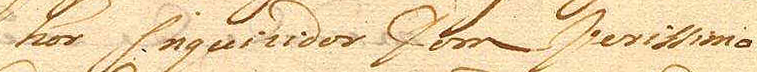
hor Jnquizidor Dom Verissimo
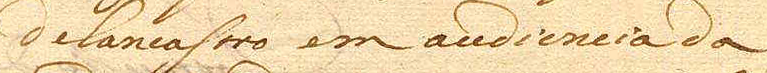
de lancastro em audiencia da
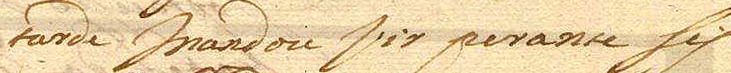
tarde Mandou Vir perante sy
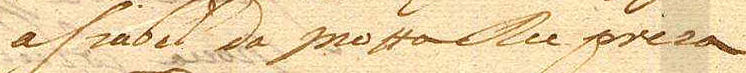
a Jzabel da motta Ree preza
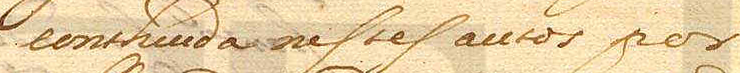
contheuda nestes autos por
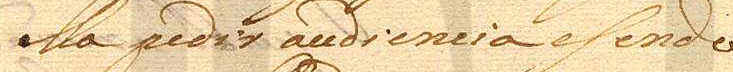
ella pedir audiencia e sendo
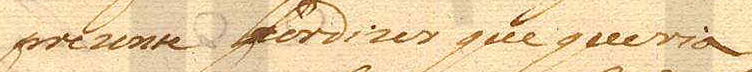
prezente por dizer que queria
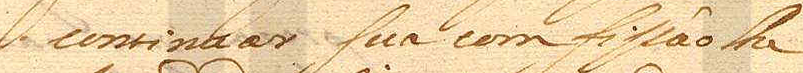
continuar sua comfissaõ lhe
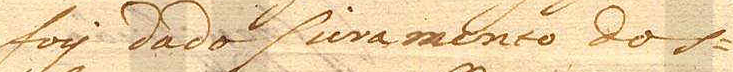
foy dado juramento dos
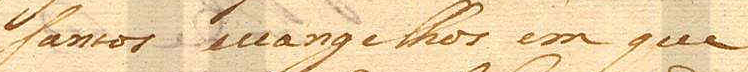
santos euangelhos em que
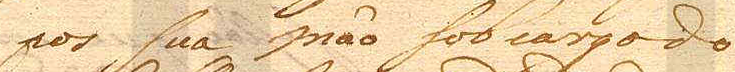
pos sua maõ sob cargo do
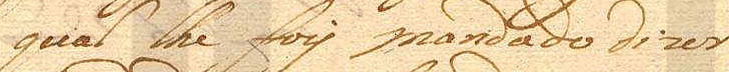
qual lhe foy mandado dizer
